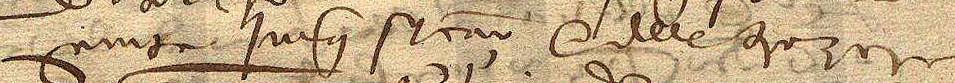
samta Jmq̄syção e delle trazerē
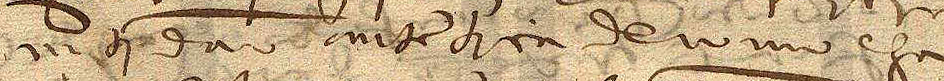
certjdão autētica de como lha
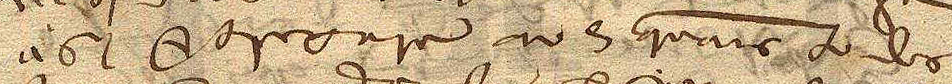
asy ētregarā aos qoaes todos
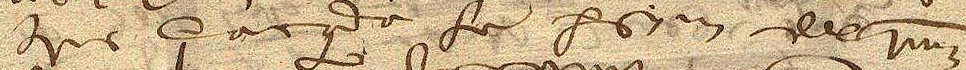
tres e a cada hū ꝑ sym elle juiz
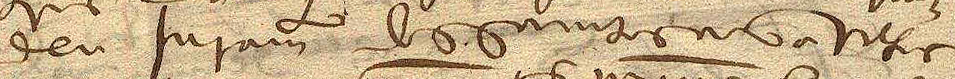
deu Juramto dos samtos avājelhos
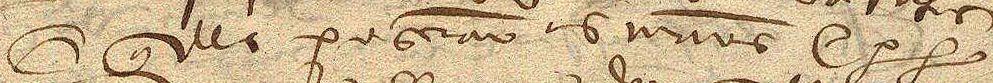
ē q̄ elles poserão as mãos e ꝑ ho
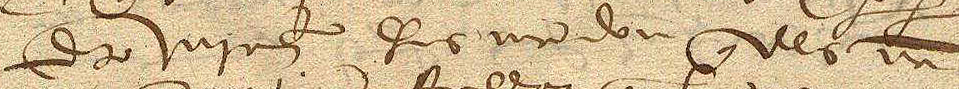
dt̄o Juramto lhes mādou q̄ elles nā
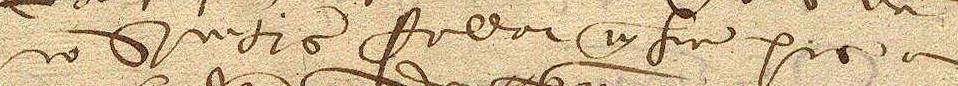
cōsjmtisē fallar nj̄huā pesoa
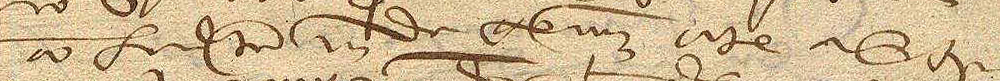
c̄o ha dt̄a mda gomez ate a ētre
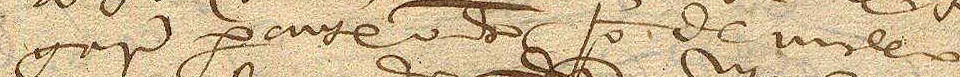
garē ꝑante o dt̄o Jō de mello
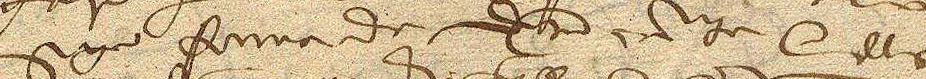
sego forma da dt̄a carta e elles
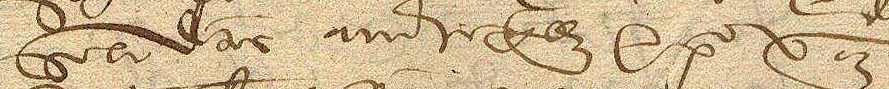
sobr̄ditos andre ḡllz e po vāz
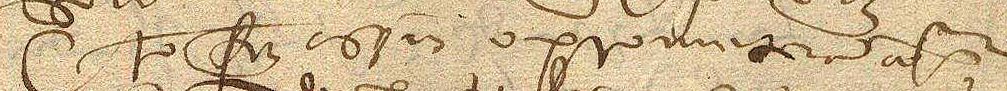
e Jō fr̄z asym o prometerā c̄op̄r
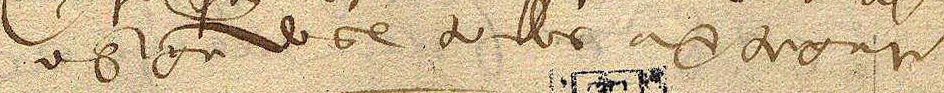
obigādo se todos a ētregarē
